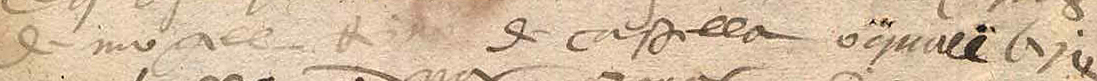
de mogell Reino de castella o quall vejo
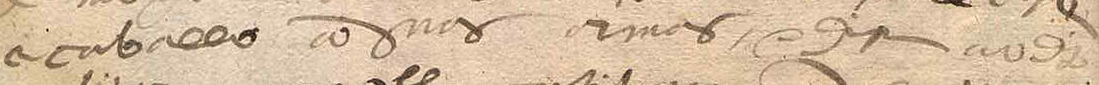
a cavallo cō suas armas / e dise ao dito
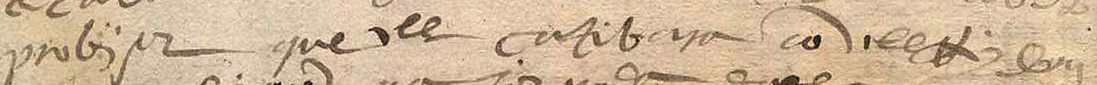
provjsor que elle cativara c̄o ell Rej dom
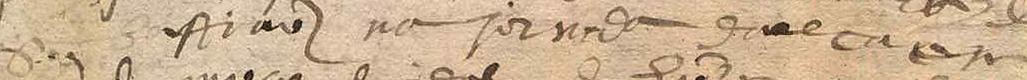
sebastiaõ na jornada dallcacere
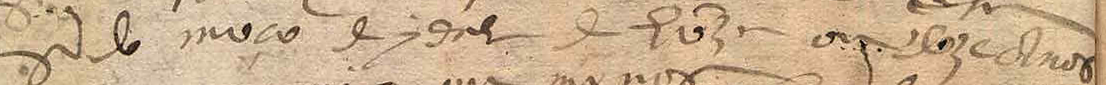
sēdo moço de jdade de hōze ou doze Anos
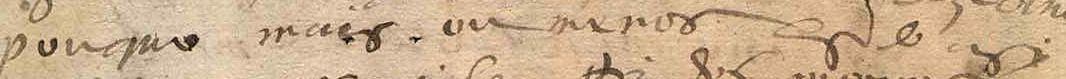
pouquo mais ou menos e sēdo asy
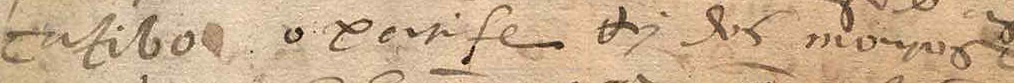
cativo o xarife Rej dos mouros
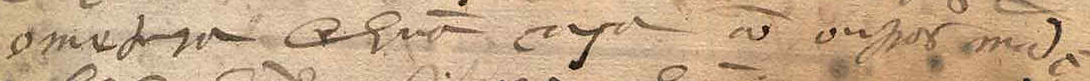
o metera ē huā casa c̄o outros māce
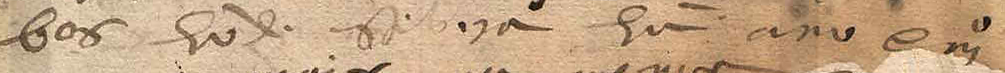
bos hōde estivera hū ano e mo
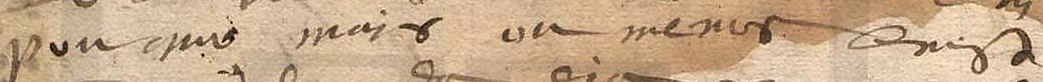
pouquo majs ou menos e neste
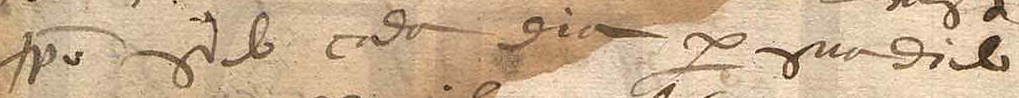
tp̄o sēdo cada dia ꝑsuadido
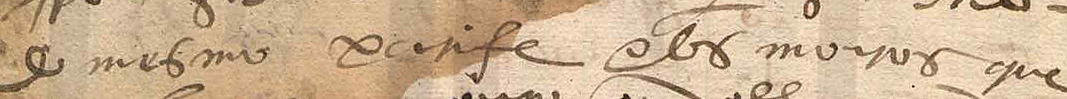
do mesmo xarife e dos mouros que
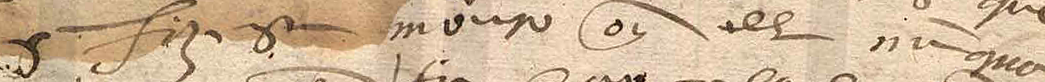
se fizese mouro o q̄ elle nūqua
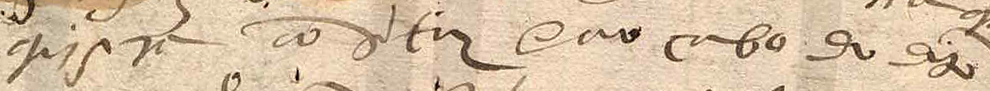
qujsera c̄osētir e ao cabo do dito
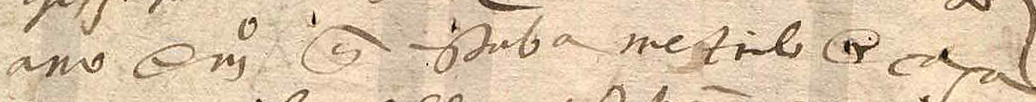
ano e mo q̄ estava metido ē casa
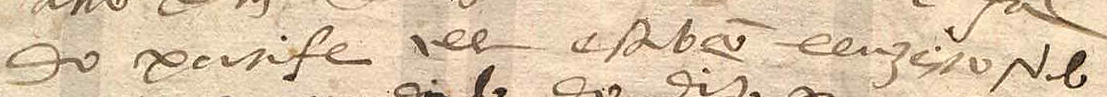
do xarife elle estevaõ lluzejro sēdo
